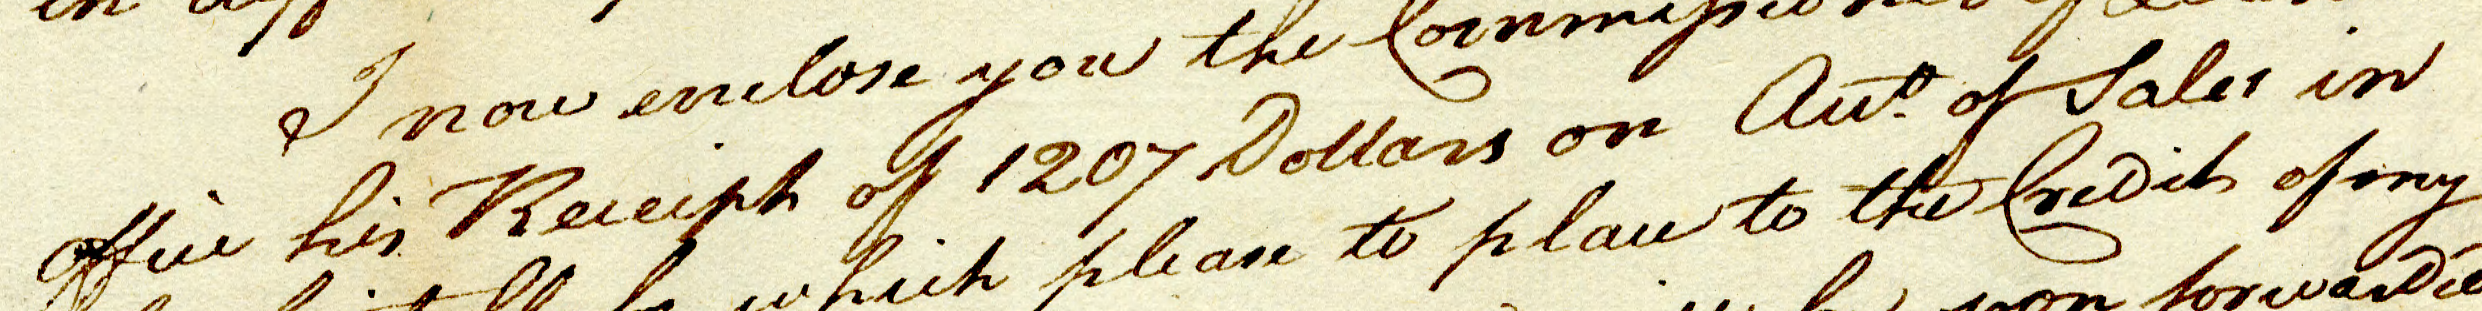Office his Receipt of 1207 Dollars on Acc^t. of Sales in
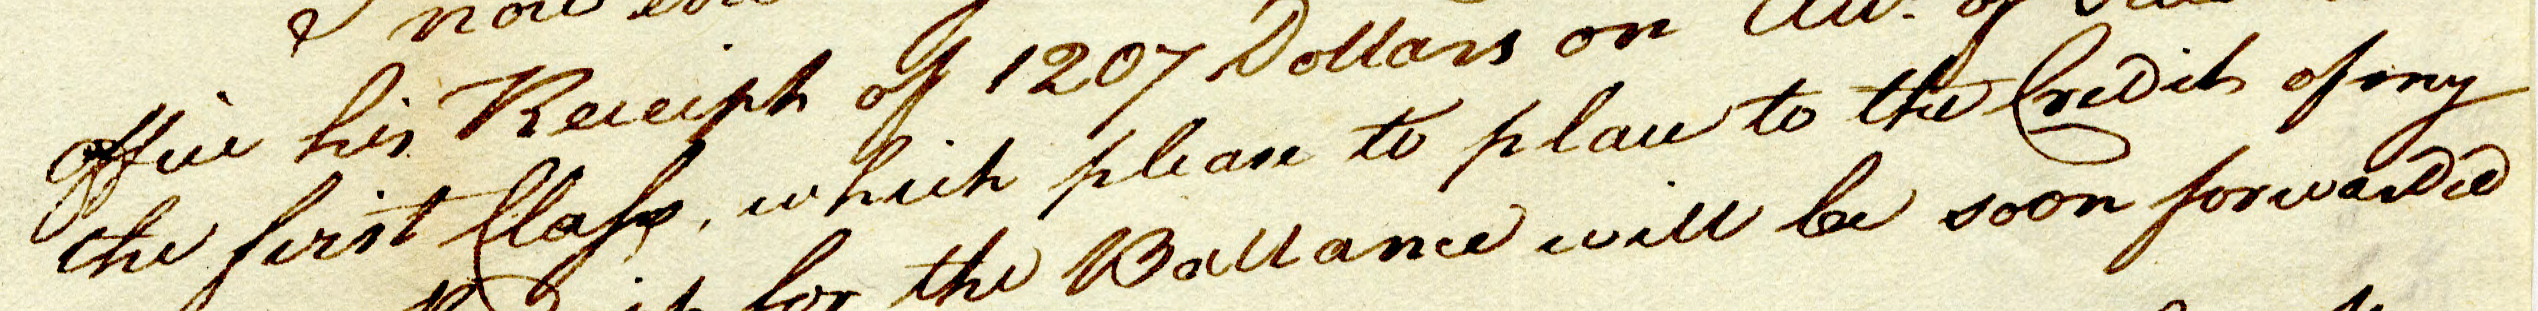the first Class, which please to place to the Credit of my
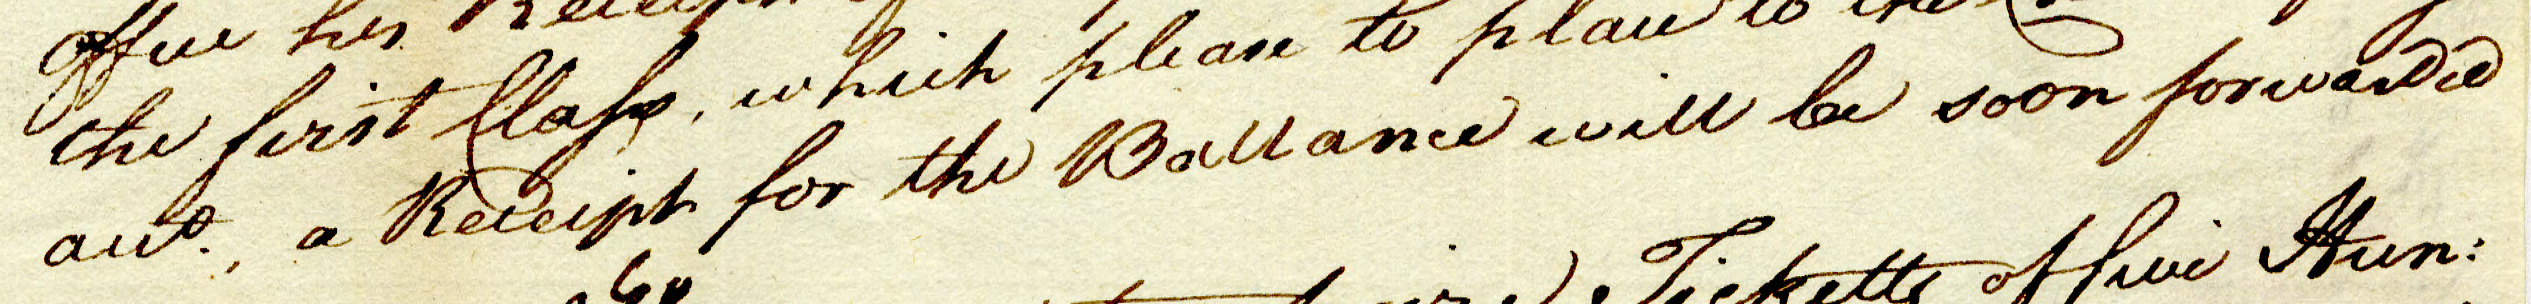acc^t., a Receipt for the Ballance will be soon forwarded
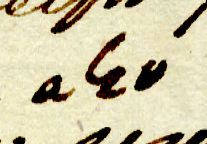also
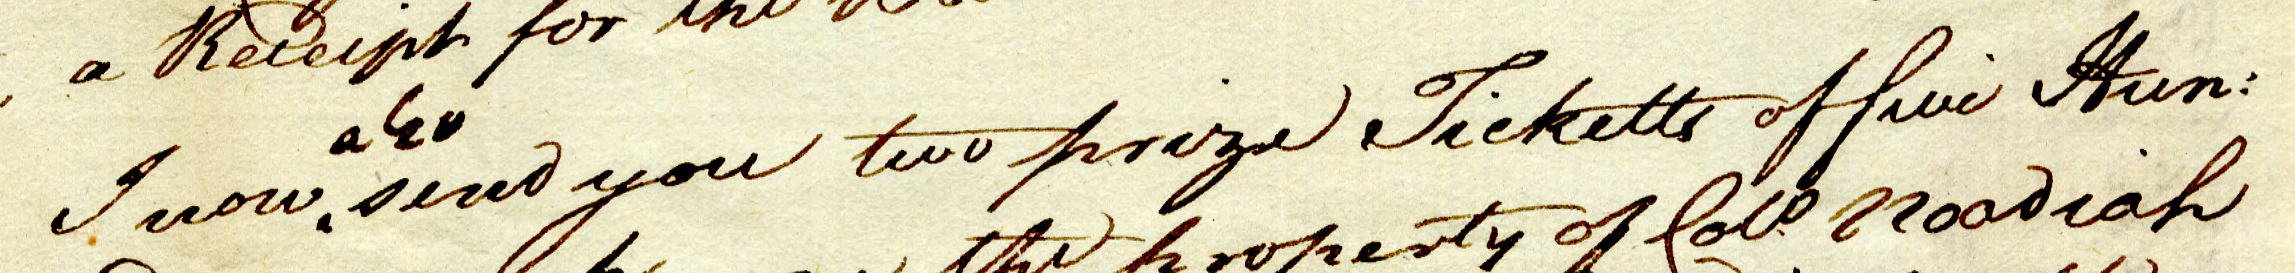I now ^ send you two prize Ticketts of five Hun-
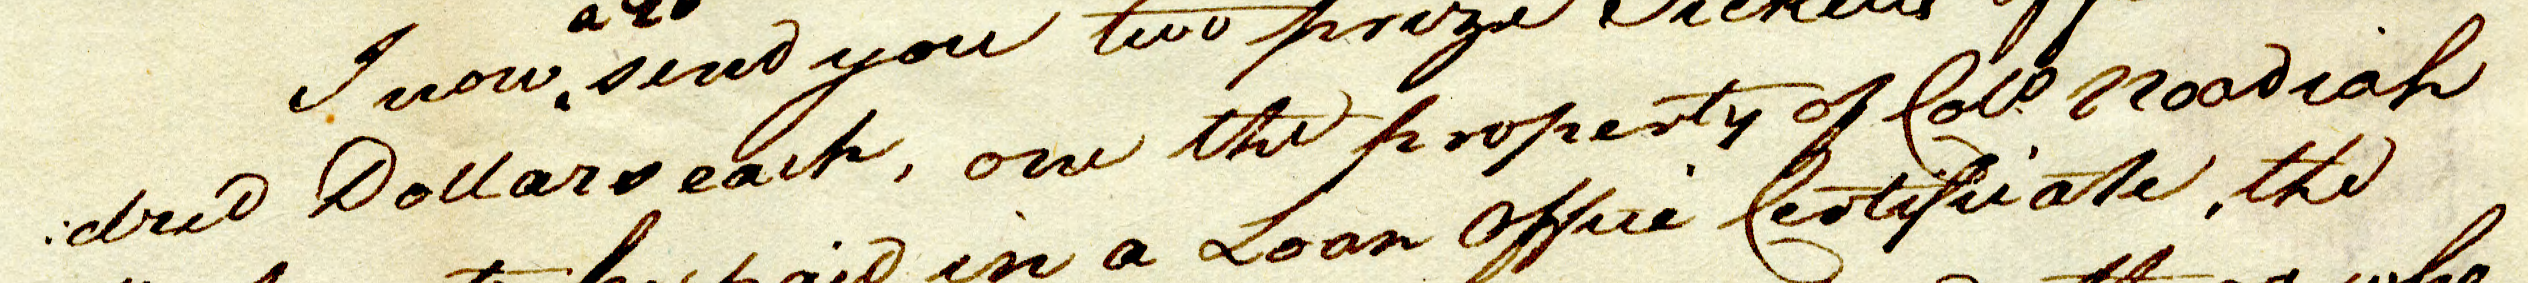-dred dollars each, on the property of Col^o Noadiah
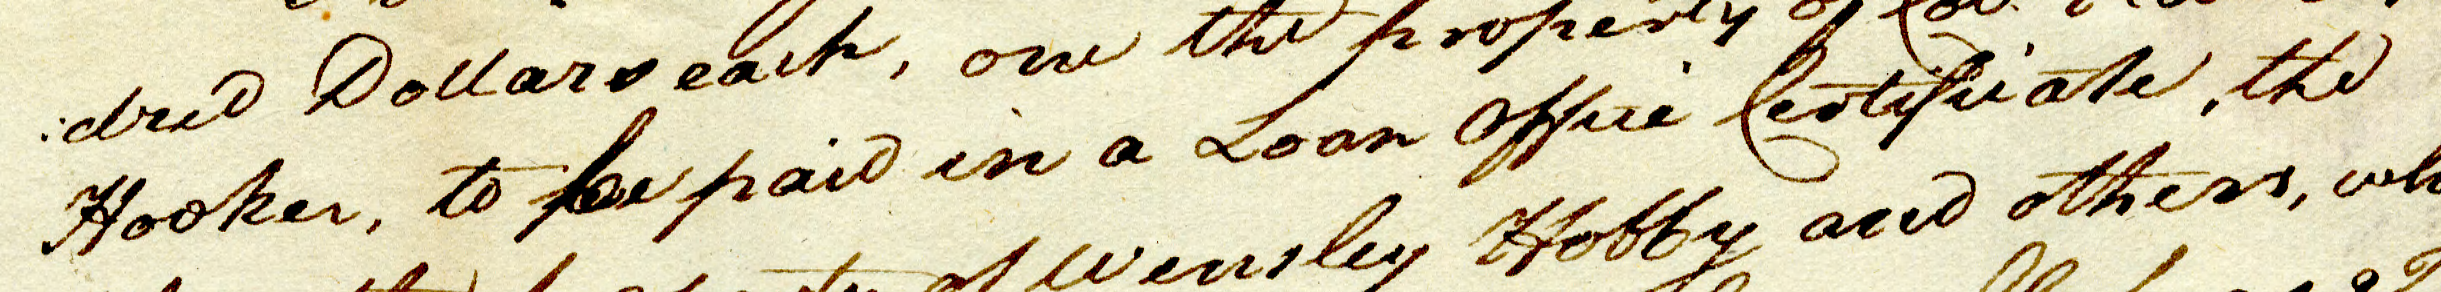Hooker, to be paid in a Loan Office Certificate the
